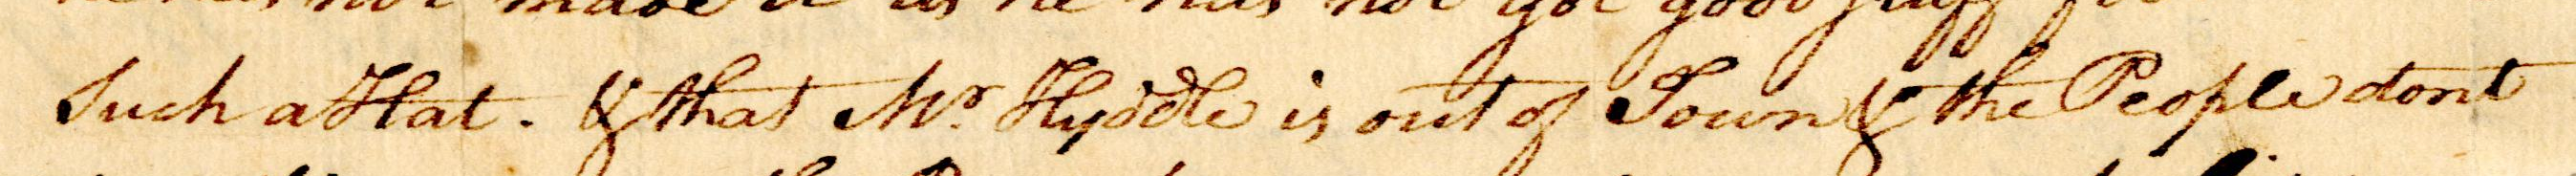Such a Hat. & that M^r. Hyddle is out of Town & the People dont
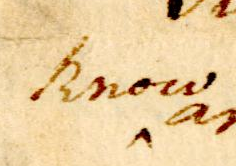Know
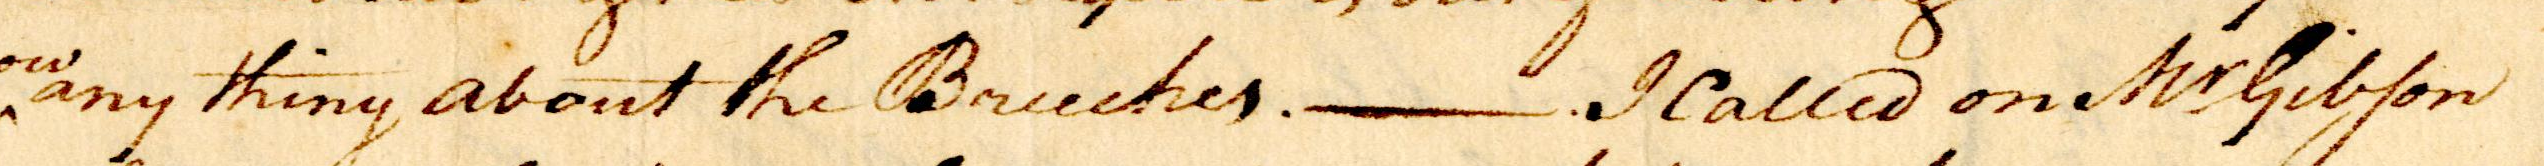^ any thing about the Breeches.- I Called on M^r Gibson
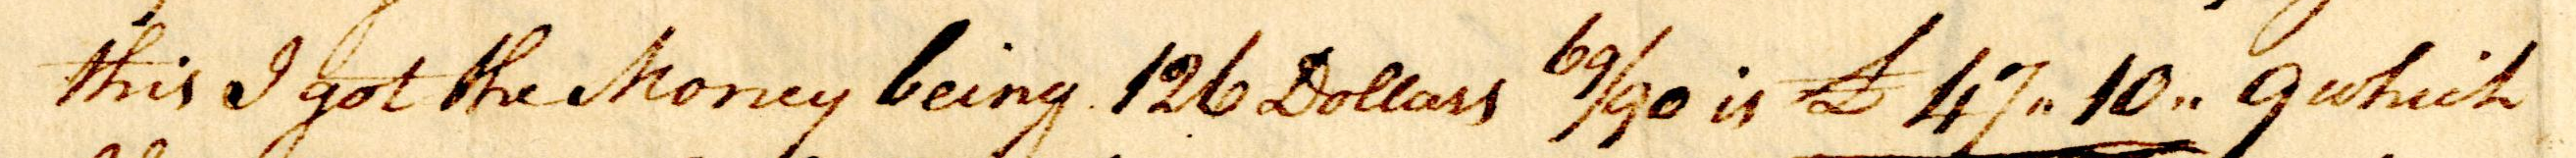this I got the Money being 126 Dollars 69s90 £47..10..9 which
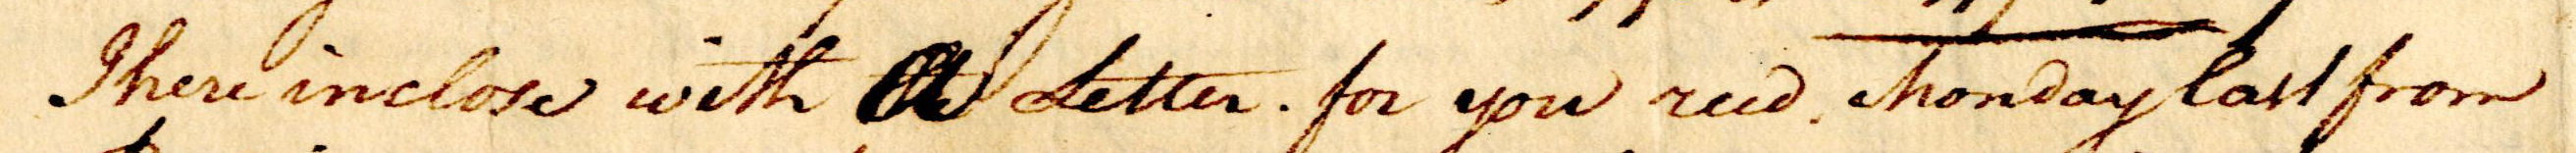I here inclose with a Letter for you rec^d, Monday last from
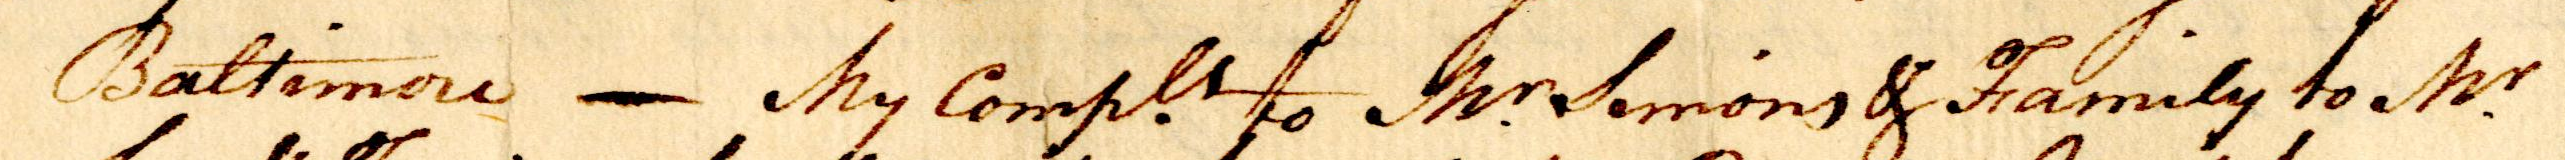Baltimore- My Compl^s to M^r Simons & Family to M^r
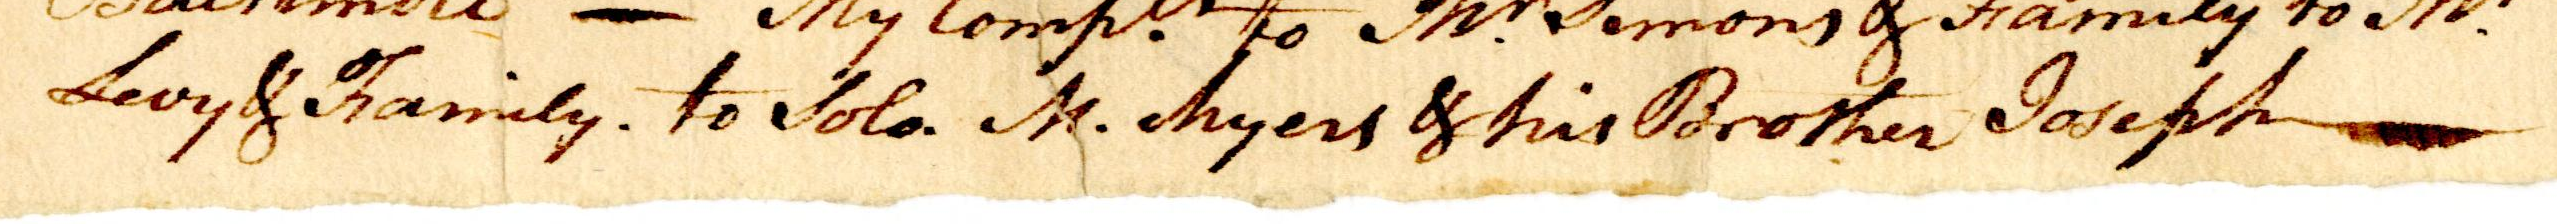Levy & Family to Solo. M. Myers & his Brother Joseph-
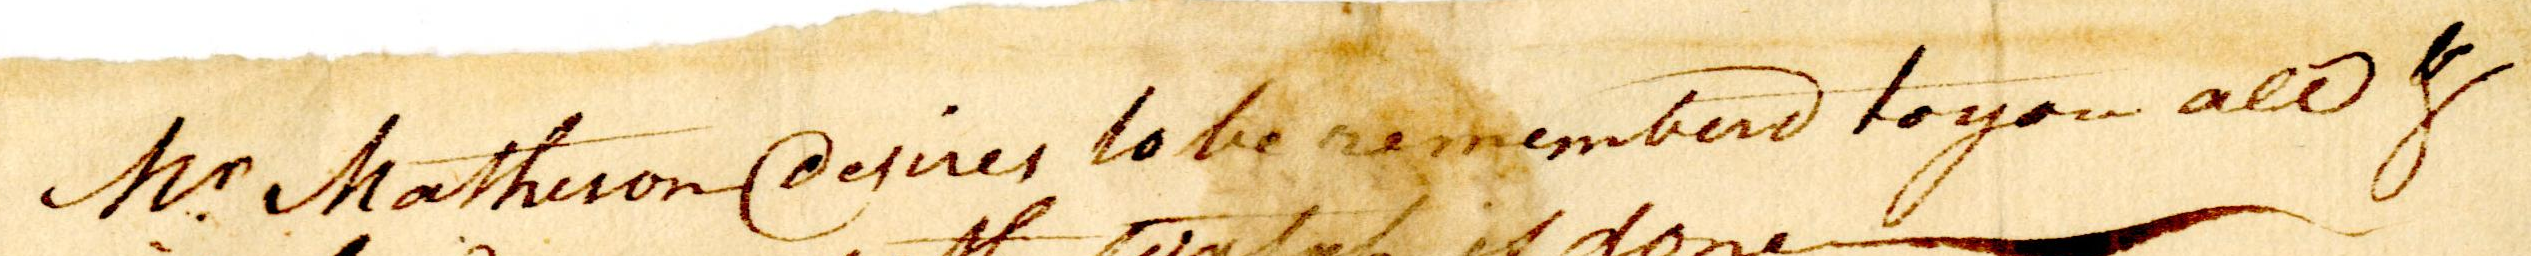M^r Matheson desires to be rememberd to you all &
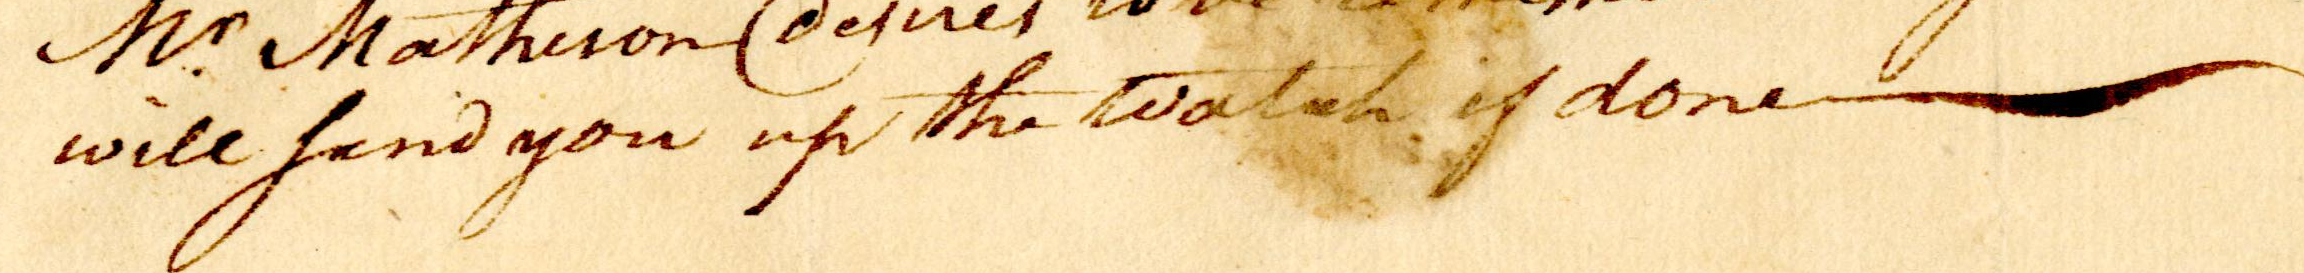will send you up the Watch if done.-
